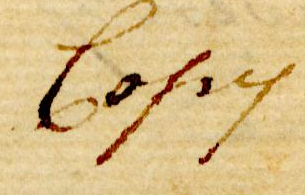Copy
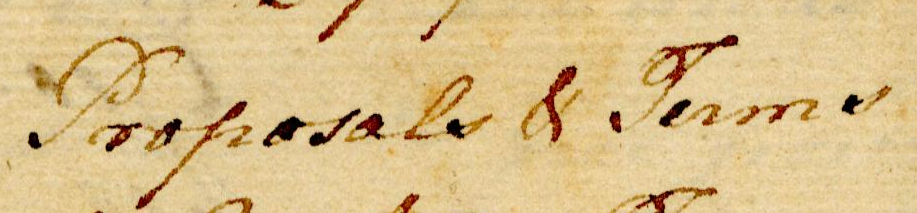proposals & Terms
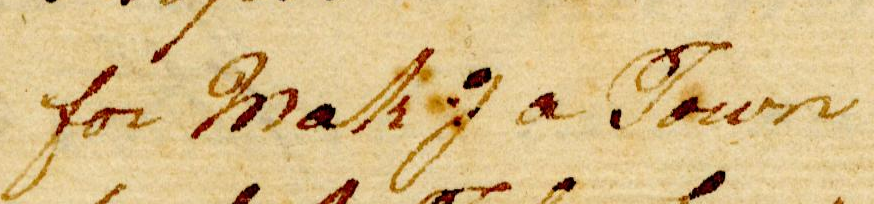for mak^g a Towm
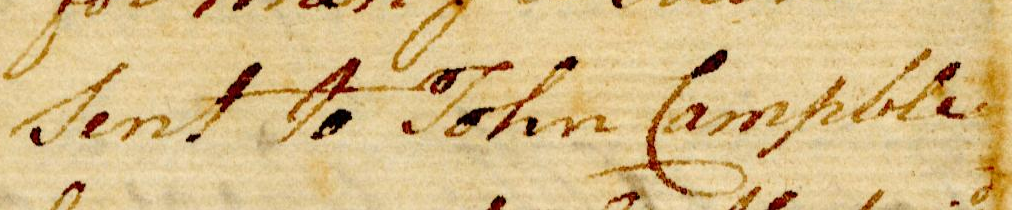Sent John Campble
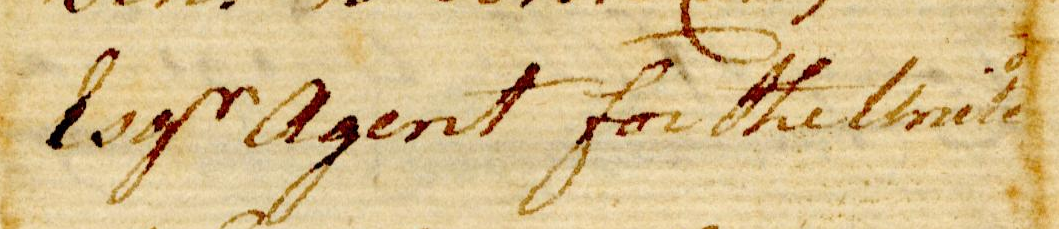Esq^r Agent for the Unite^d
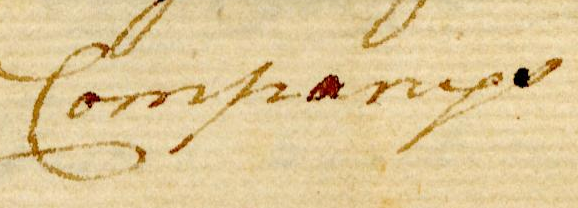Company
